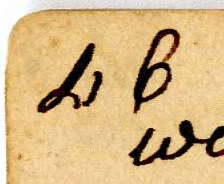46
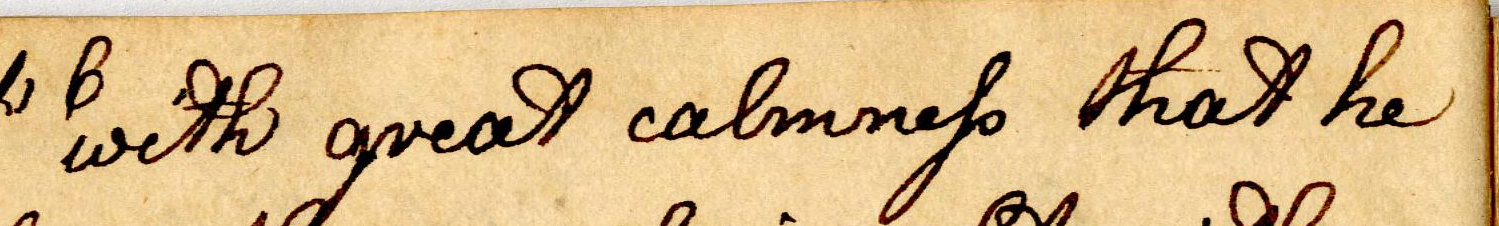with great calmness that he
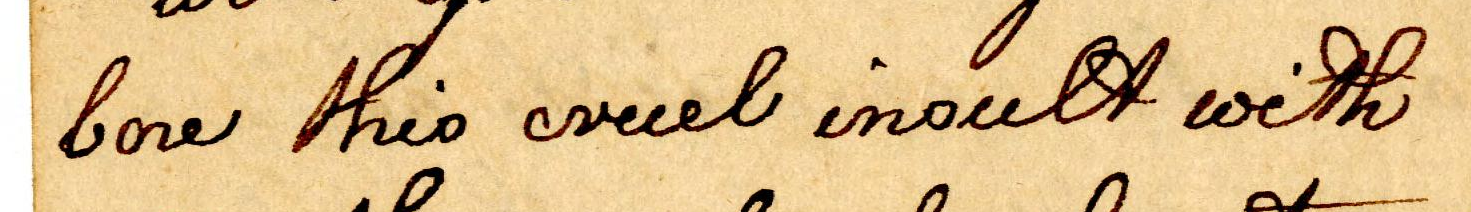bore this cruel insult with
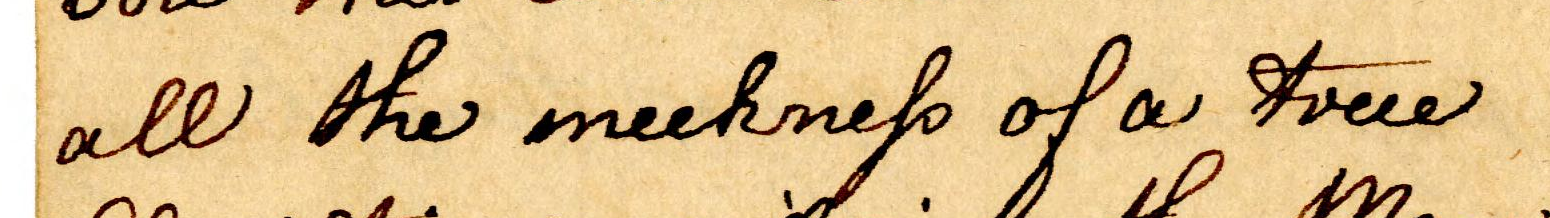all the meekness of a true
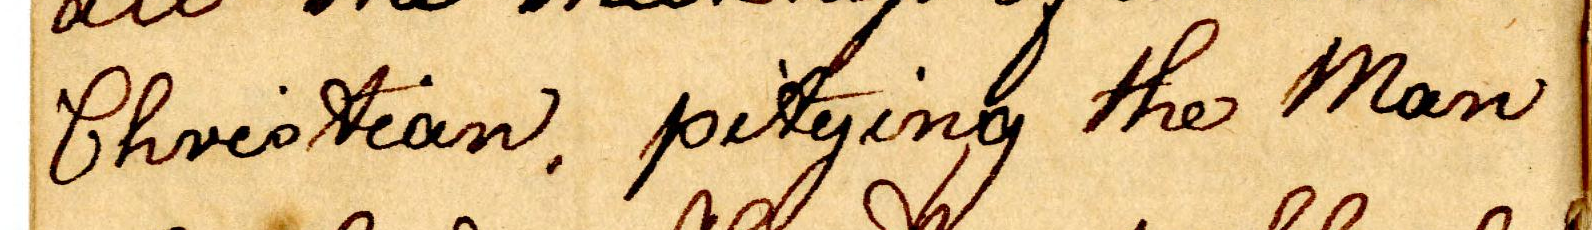Christian, pitying the Man
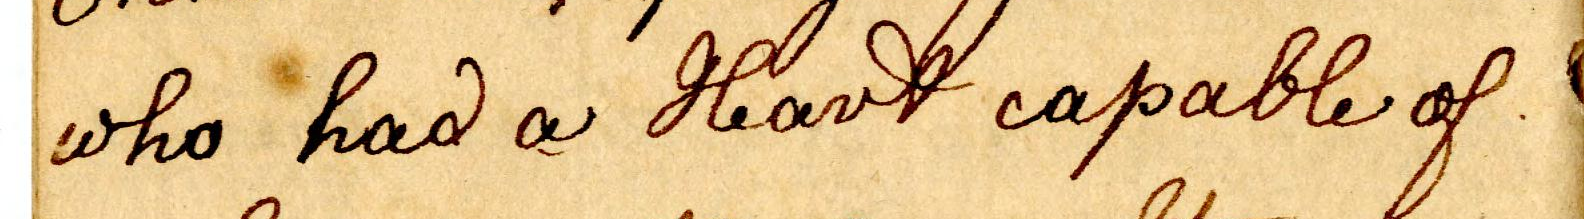who had a Heart capable of
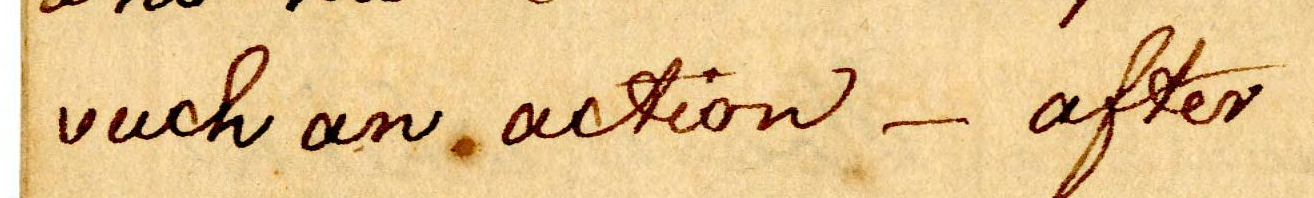such an action- after
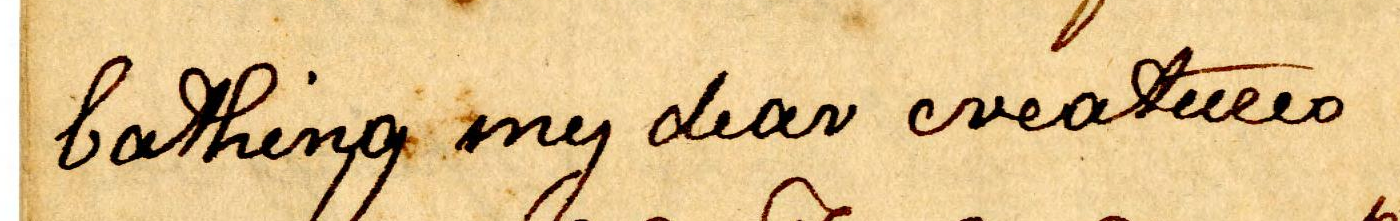bathing my dear creatures
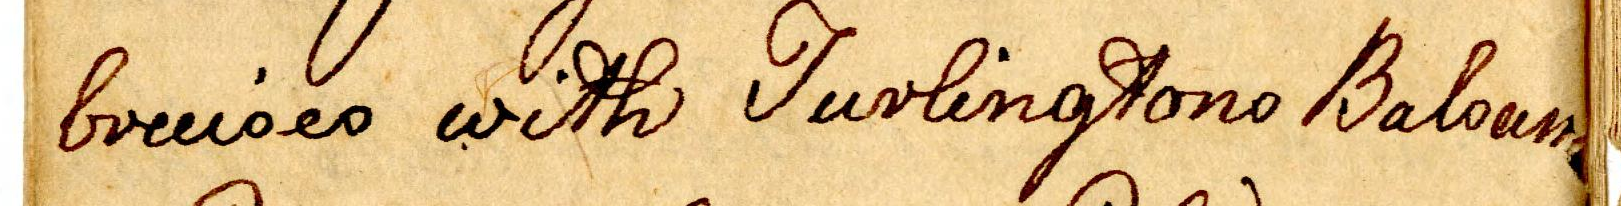bruises with Turlingtons Balsam
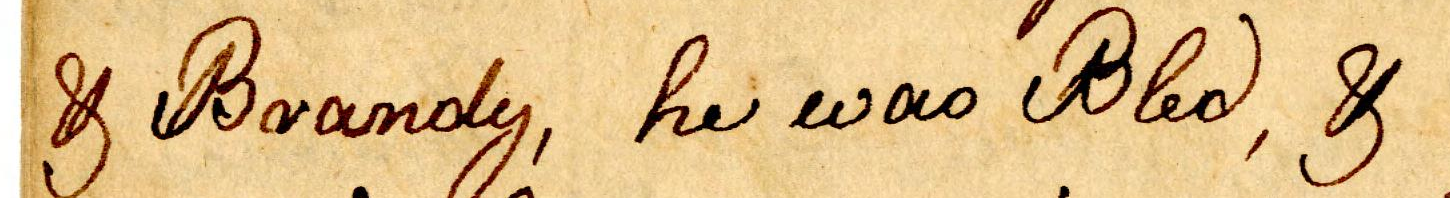& Brandy, he was Bled, &
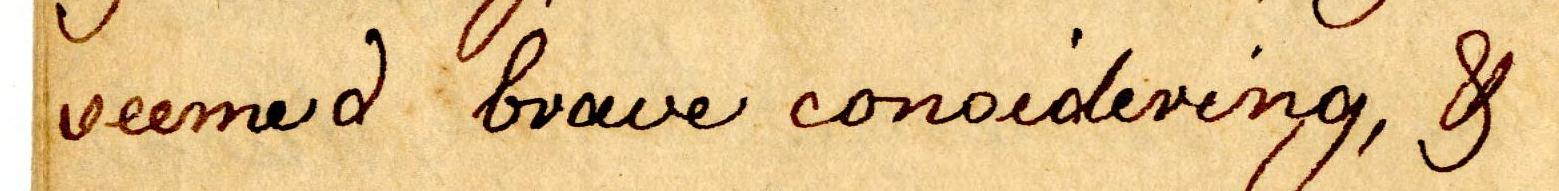seemed brave considering, &
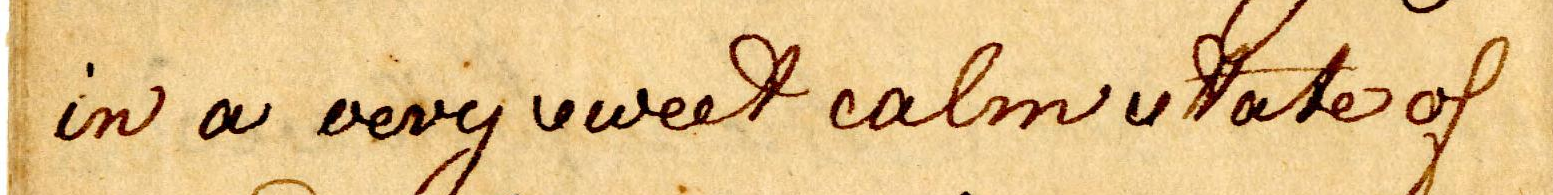in a very sweet calm state of
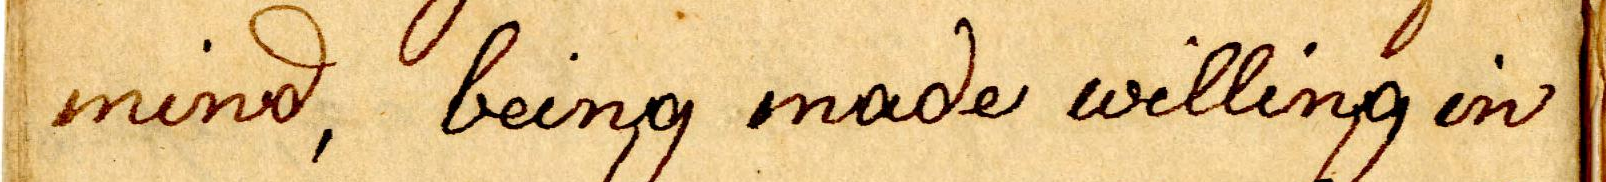mind, being made willing in
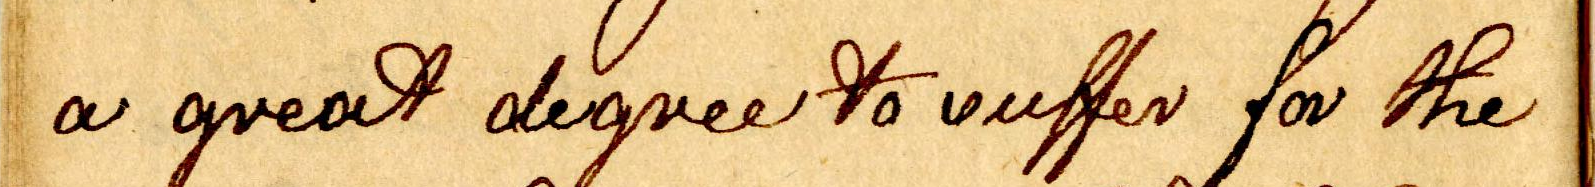a great degree to suffer for the
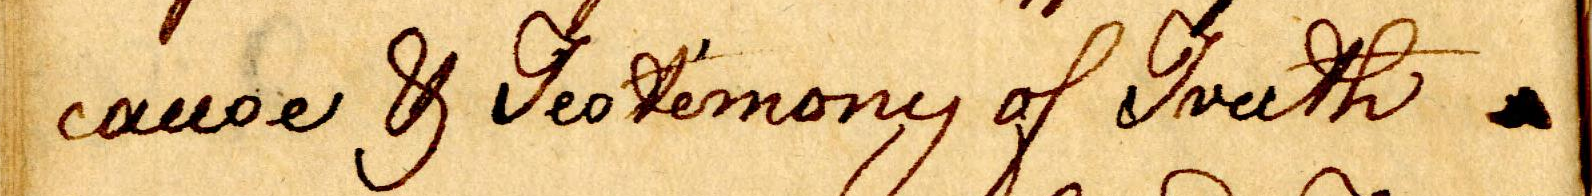cause & Testimony of Truth
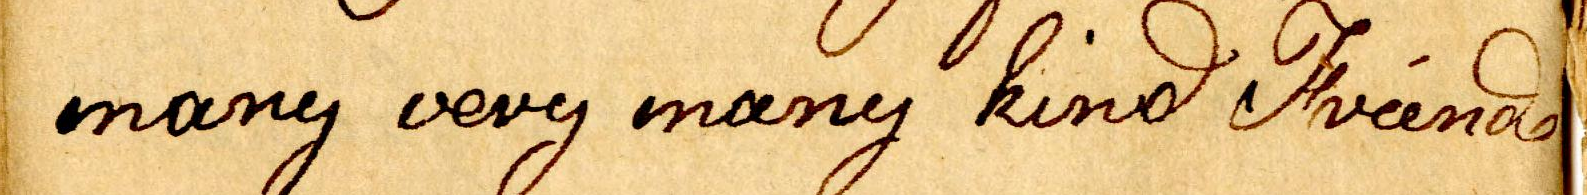many very many kind Friends
